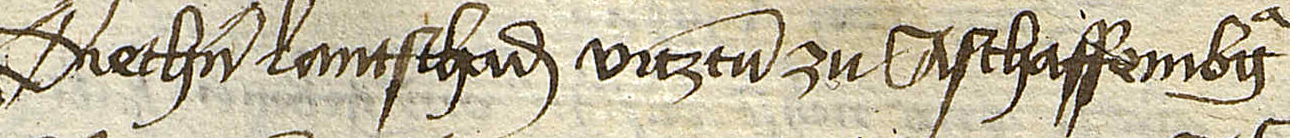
Dieth*n lantſchad* vicʒtu* ʒu Aſchaffembg*
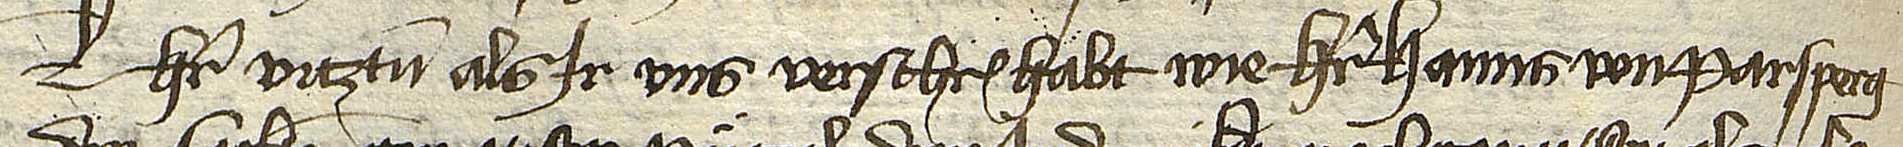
L* h*r vicʒtu* als Ir vns verſchr* habt wie H*r Hanns von Parſperg
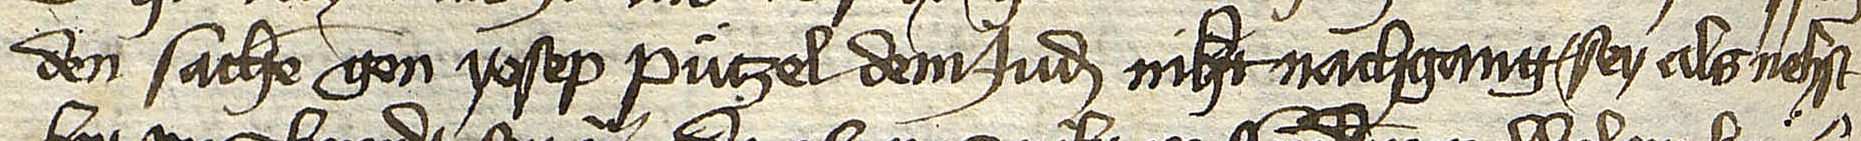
den ſache* gen Yoſep Pücʒel dem Iud* niht nachgang* ſey als nehſt
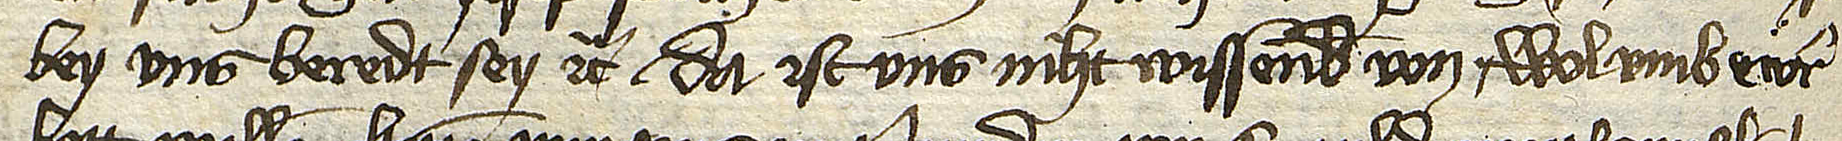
bey vns beredt ſey ec* / Da iſt vns niht wiſſend von / Wol vmb ew*r
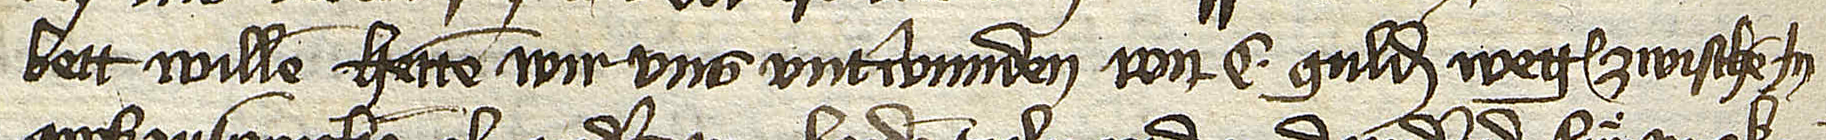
bett wille* hette* wir vns vnt*wunden von C . guld* weg* ʒwiſche* In
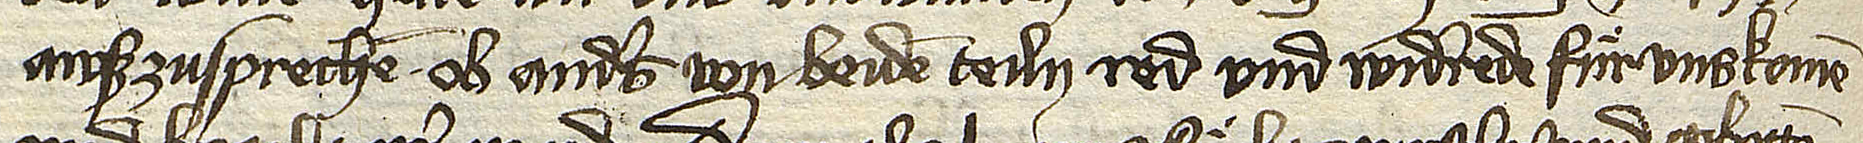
awſʒʒuſpreche* . ob and*s von beide* teiln red vnd wid*rede für vns kome*
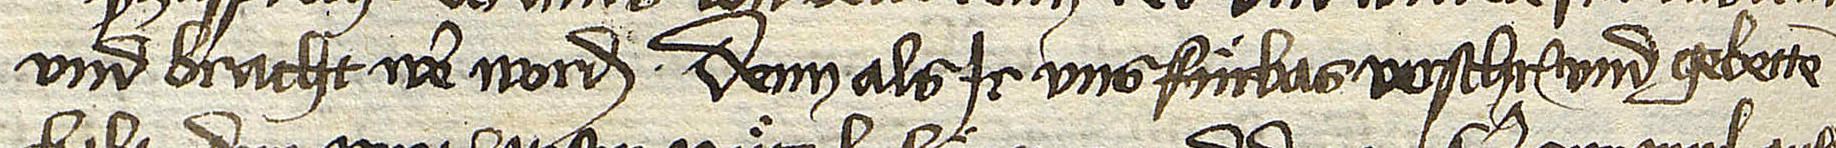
vnd bracht w*e word* . Denn als Ir vns fürbas verſchr* vnd gebette*
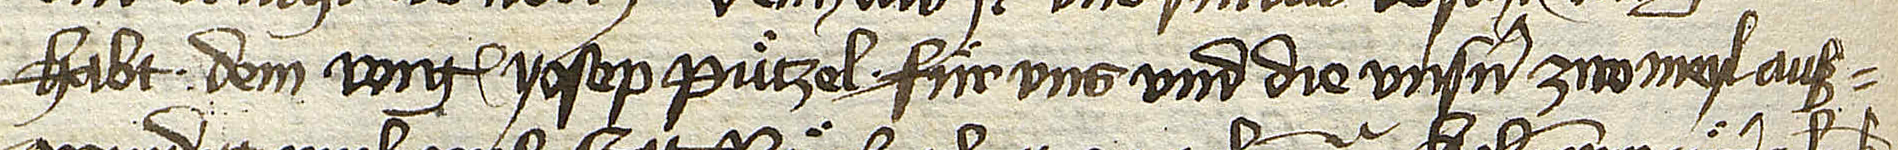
habt . dem vorg* Yoſep Pücʒel . für vns vnd die vnſ*n ʒwo meyl auſʒ =
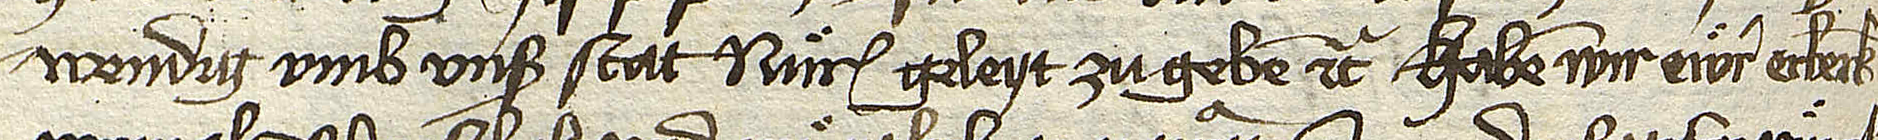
wendig vmb vnſ* ſtat Nür* geleyt ʒu gebe* ec* / Habe* wir ew*r erberk*
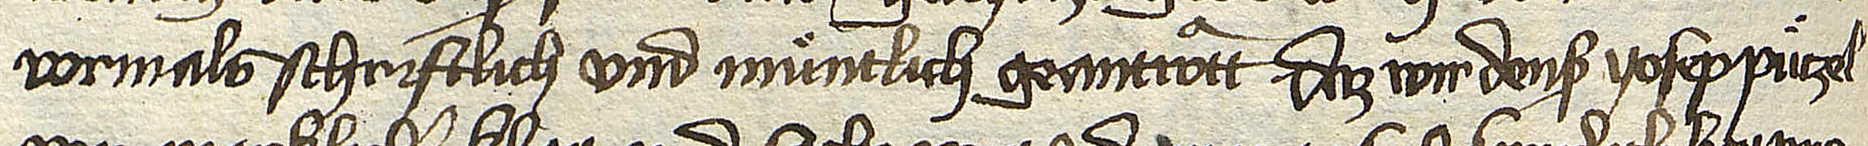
vormals ſchriftlich vnd müntlich geantw*tt . daʒ wir denſ* Yoſep pücʒel
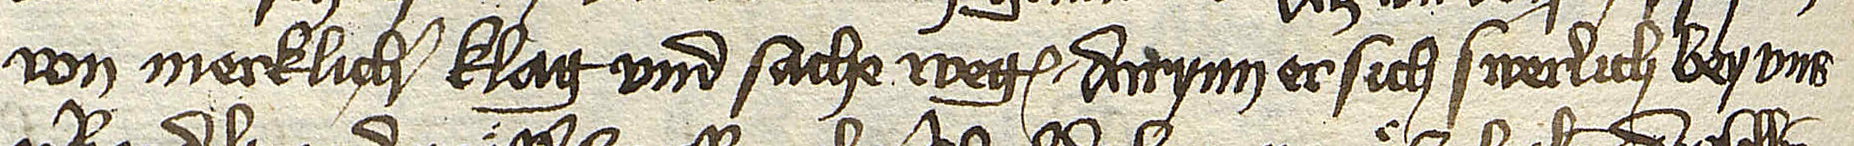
von merklich* klag vnd ſache weg* / darynn er ſich ſwerlich bey vns
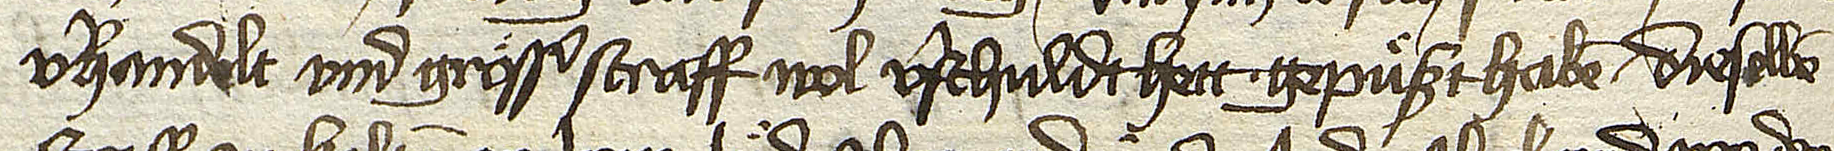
v*handelt vnd gröſſ* ſtraff wol v*ſchuldt hett . gepüſʒt habe / Dieſelbe*
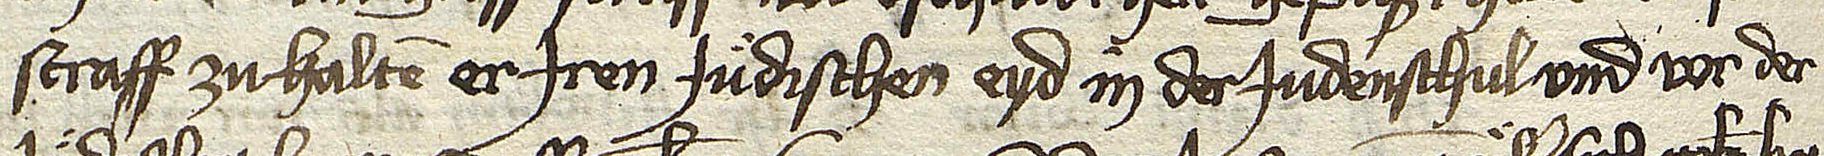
ſtraff ʒu halte* er Iren Iüdiſchen eyd in der Iudenſchul vnd vor der
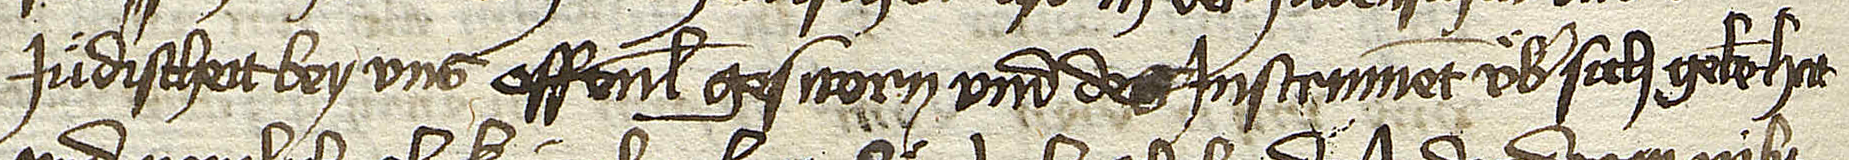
Iüdiſcheit bey vns offenl* geſworn vnd de% Inſtrumet* v̈b* ſich gebe* hat
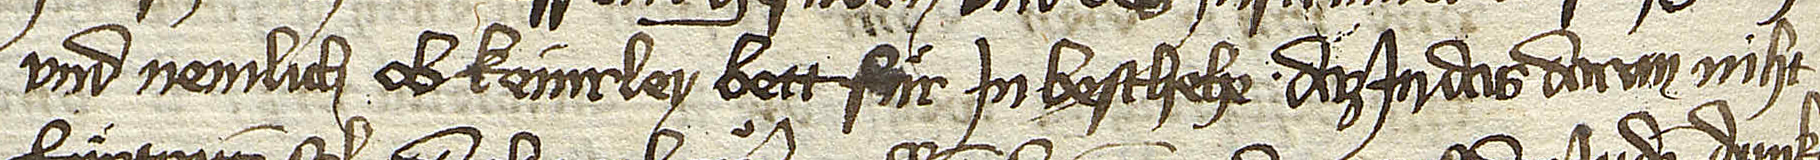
vnd nemlich ob keinrley bett für In beſchehe . daʒ In das daran niht
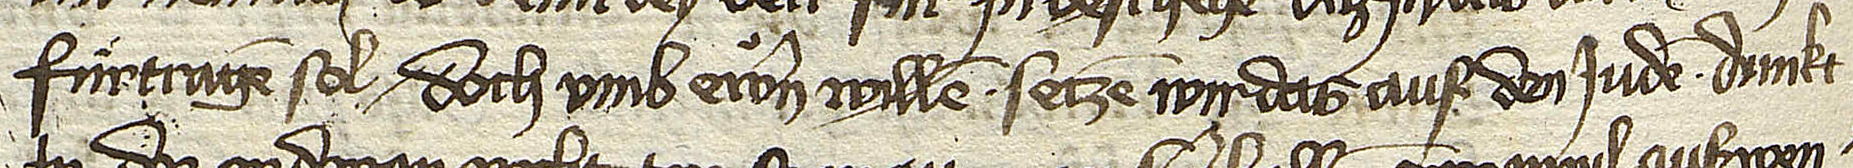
fürtrage* ſol / Doch vmb ew*n wille* . ſecʒe* wir das auf den Iude . dunkt
